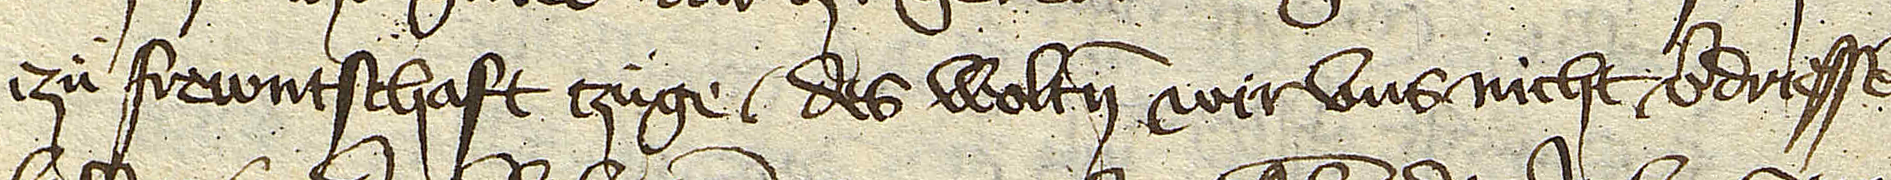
cʒü frentſchaft cʒüge / des woltn* wir vns nicht v*drieſſe*
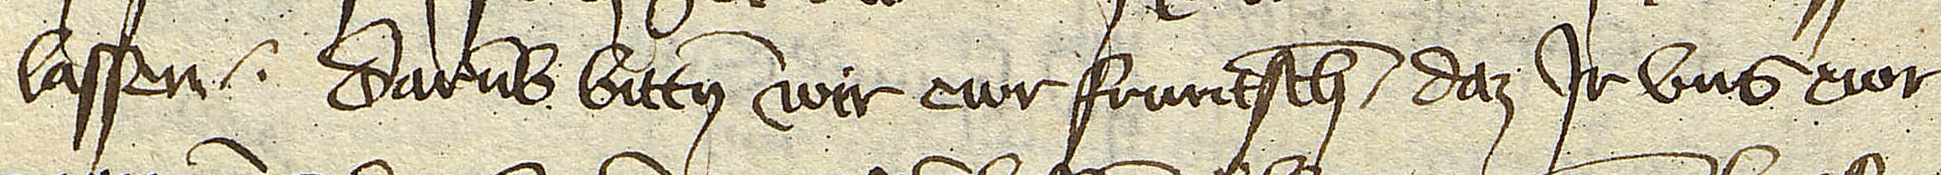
laſſen / . Darub* bittn* wir ewr fruntſch* / daʒ Ir vns ewr
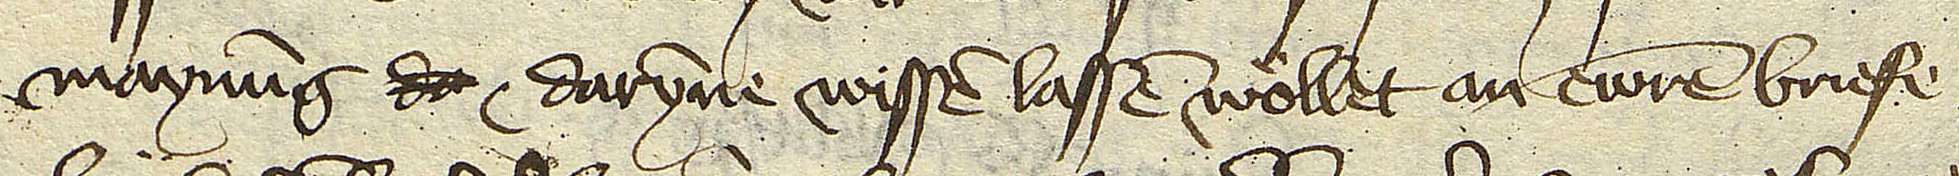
maynug* da / daryne* wiſſe* laſſe* wöllet an ewre* briefe
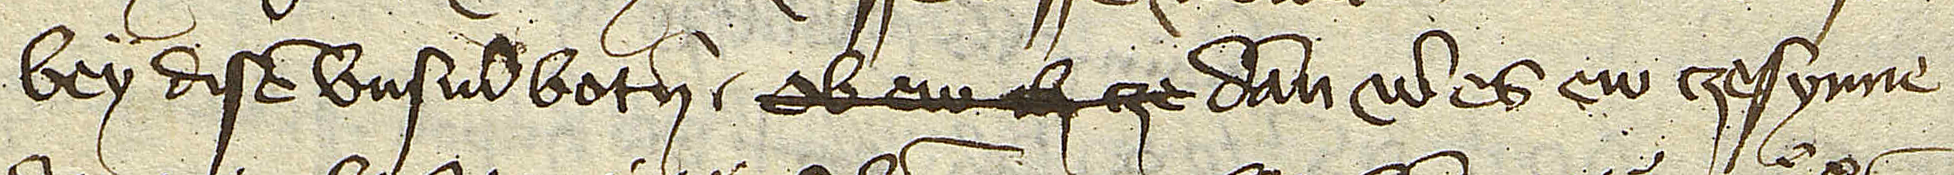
bey diſe* vnſm* botn* / ob ew ih cʒe dan* w* es ew cʒeſynne
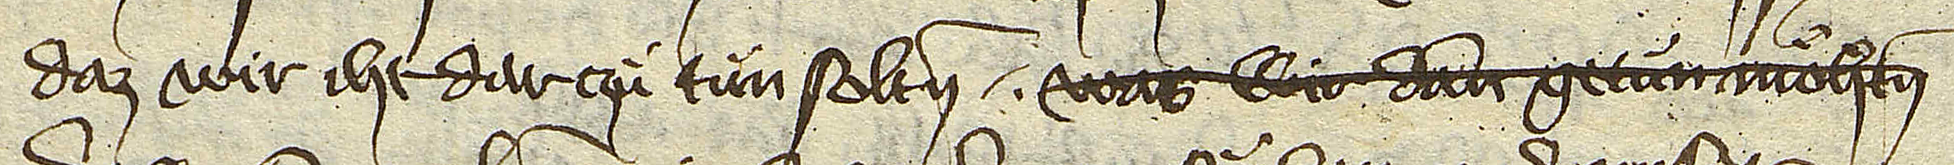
daʒ wir iht darcʒü tün ſoltn* / . was wir dan* getün möhtn*
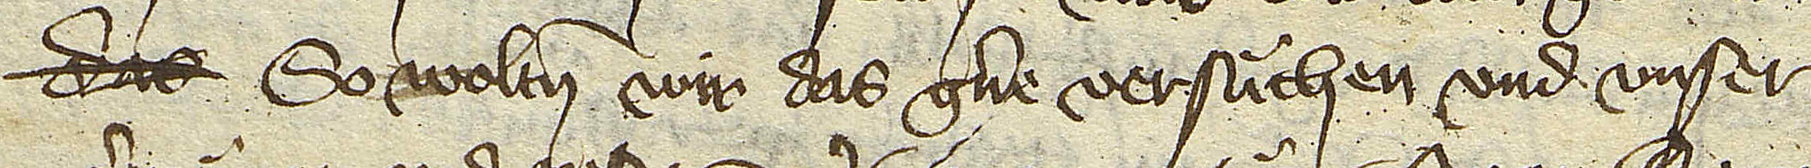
Das So woltn* wir das gn*e verſüchen vnd vnſer
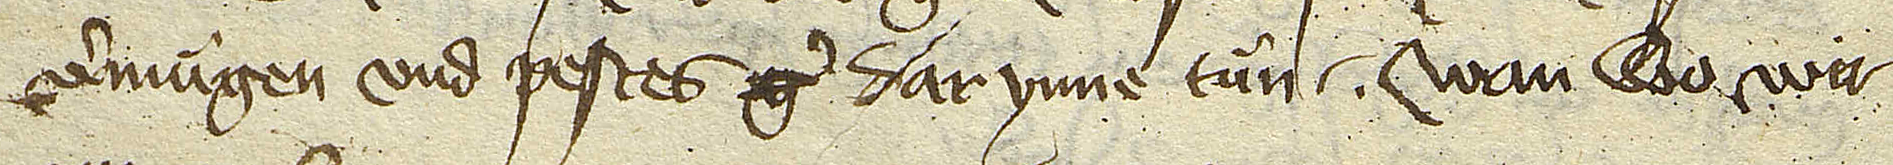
v*mügen vnd peſtes g* darynne tün / . wan wo wir
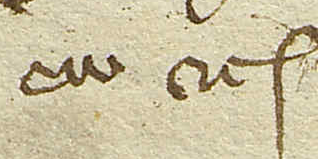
ew ec*
